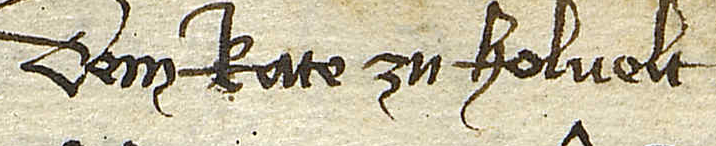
Dem Rate ʒu Holuelt
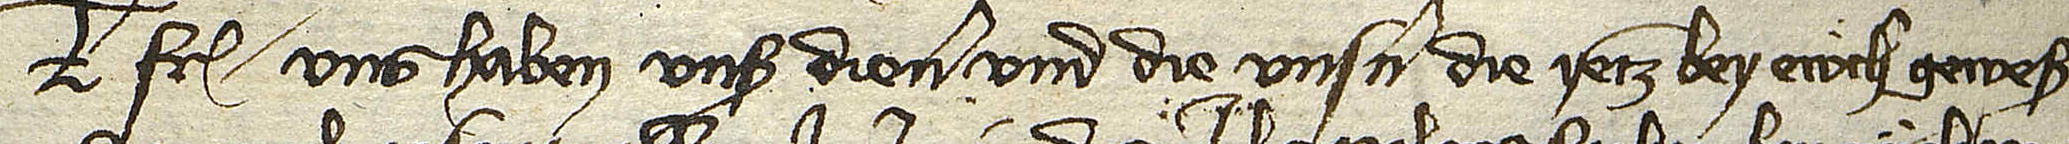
L* fr* / vns haben vnſ* dien* vnd die vnſn* die yecʒ bey ewch geweſ*
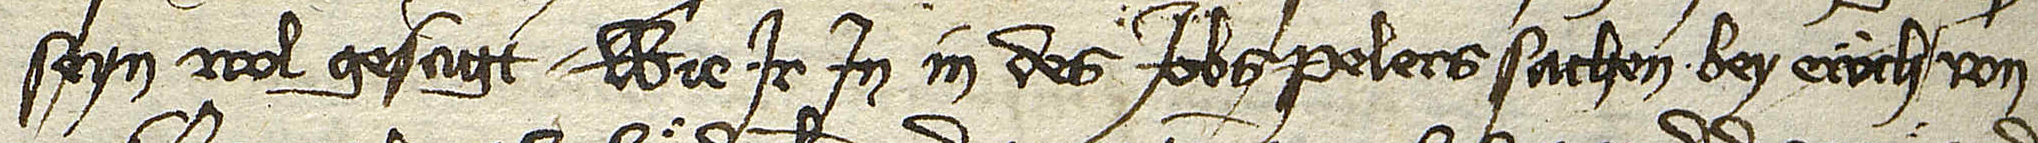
ſeyn wol geſagt / wie Ir In in des Iobs Pelers ſachen . bey ewch / von
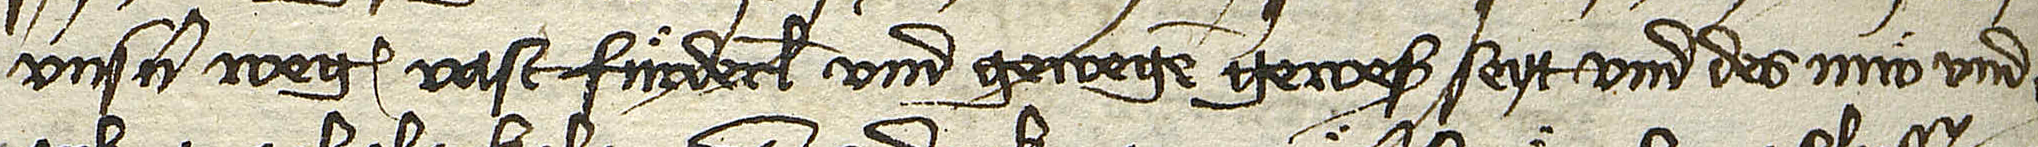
vnſn* weg* vaſt fürderl* vnd gewege* geweſ* ſeyt vnd des mw vnd
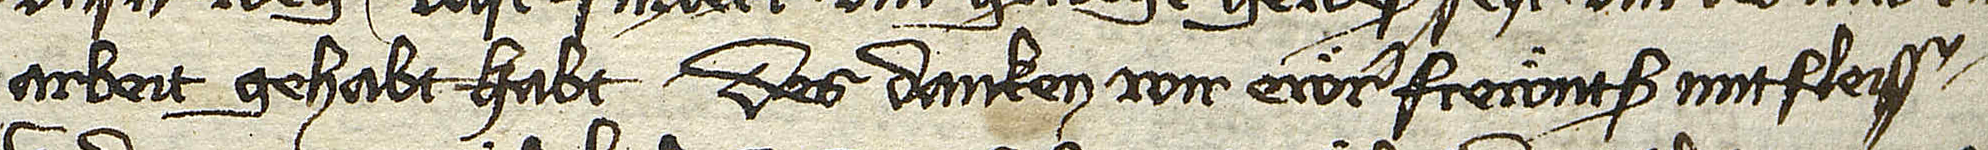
arbeit gehabt habt / Des danken wir ewr frewntſ* mit fleiſſ
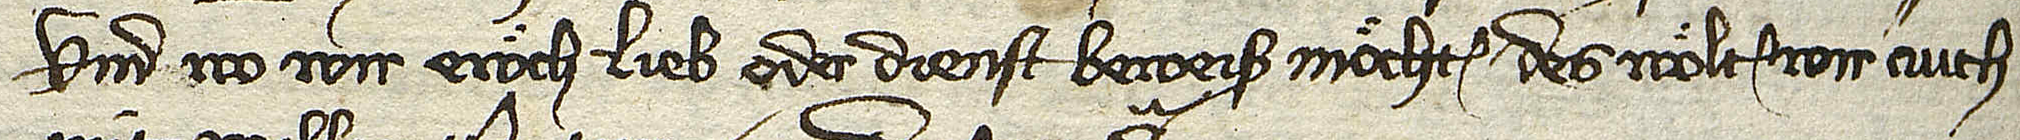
vnd wo wir ewch lieb oder dienſt beweiſ* möcht* / des wölt* wir auch
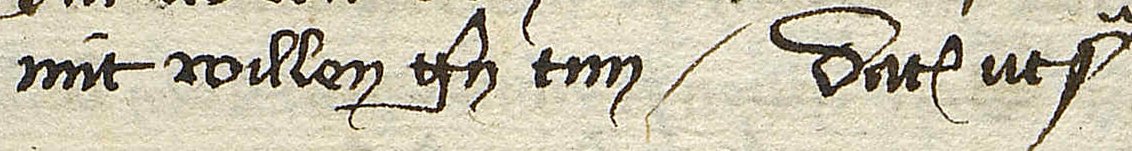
mit willen g*n tun / Dat* ut ſ*
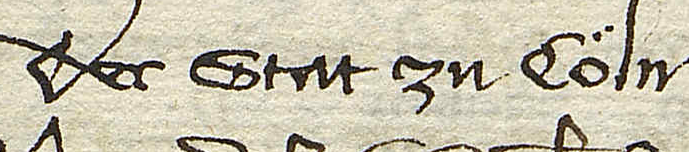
Der Stat ʒu Cöln
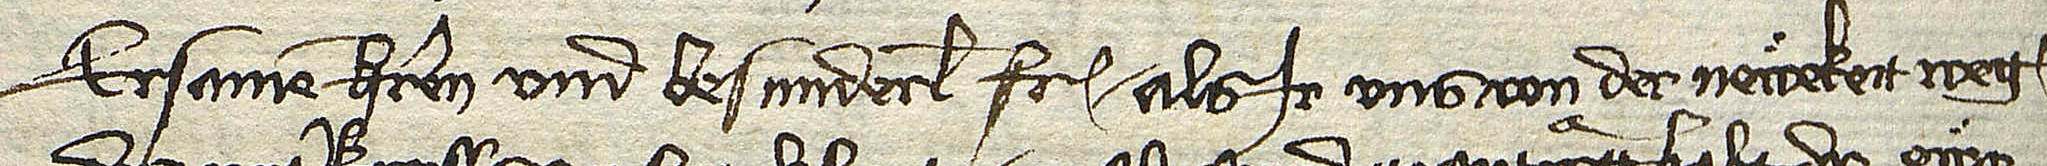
Erſame* Hr*en vnd beſunderl* fr* / als Ir vns von der newekeit weg*
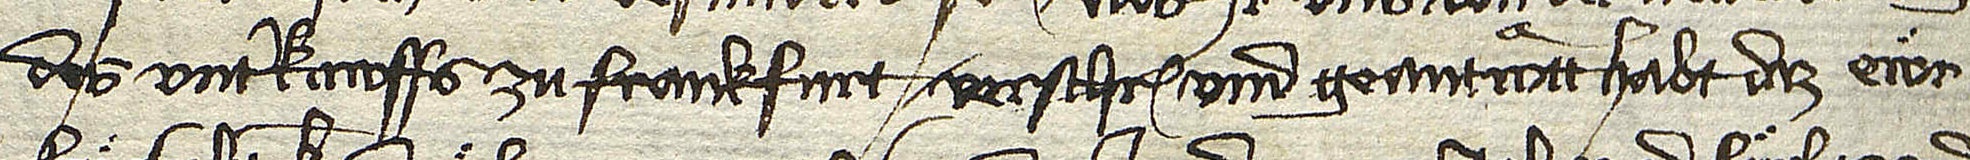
des vnt*kawffs ʒu frankfurt / verſchr* vnd geantw*tt habt daʒ ewr
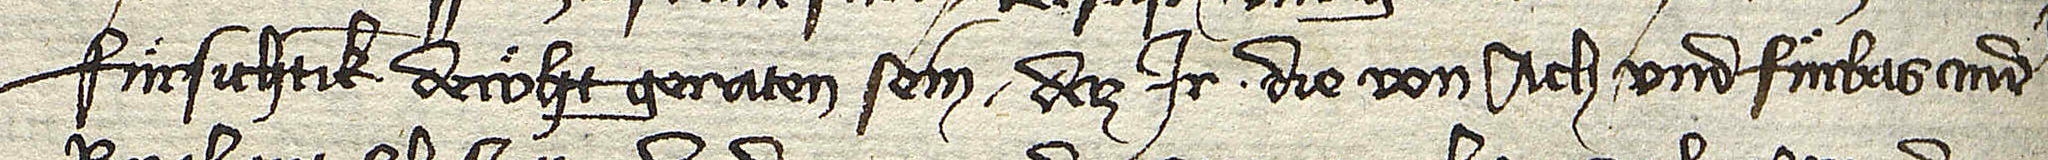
fürſichtik* dewht geraten ſein / daʒ Ir . die von Ach vnd fürbas and*
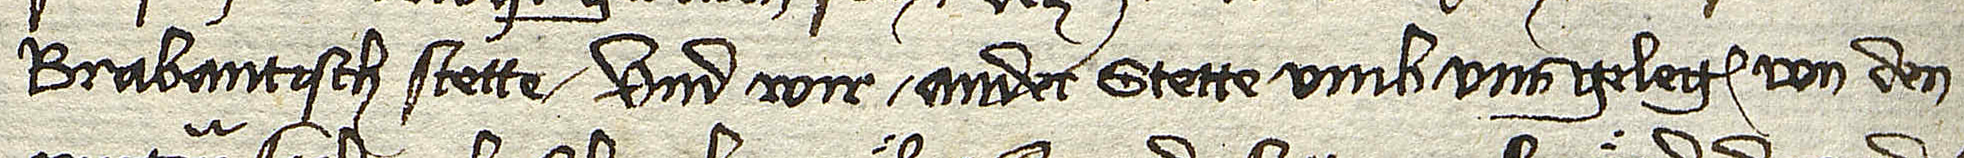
Brabantiſch ſtette / Vnd wir / ander Stette vmb vns geleg* von den
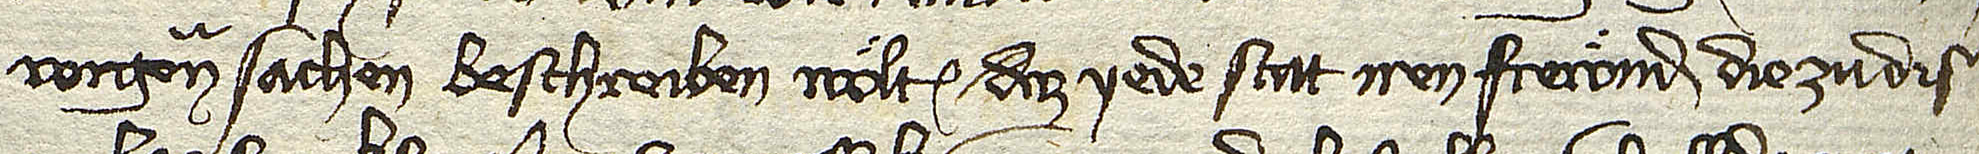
vorgen* ſachen beſchreiben wölt* / daʒ yede ſtat iren frewnd* die ʒu diſ*
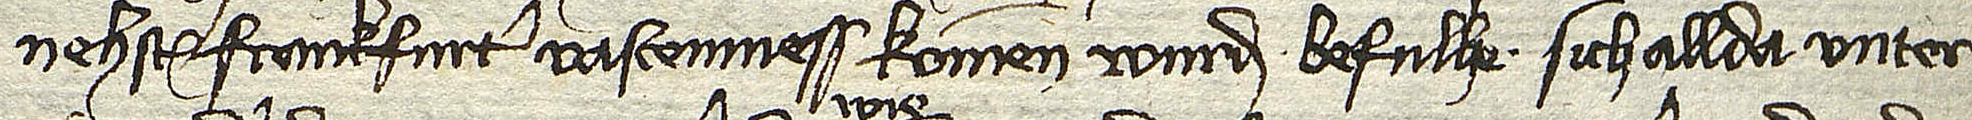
nehſt* frankfurt* vaſtenmeſſ kom*en wurd* befulhe . ſich allda vnter
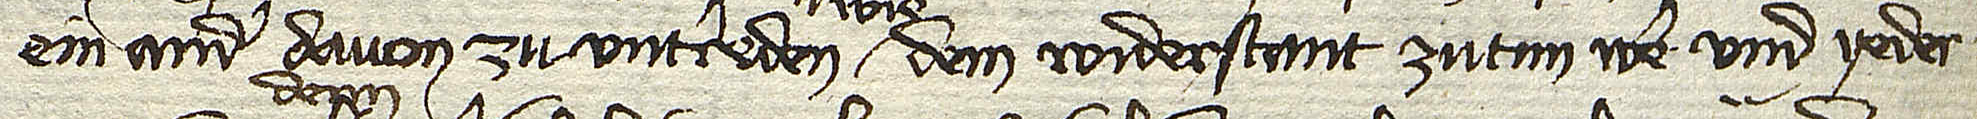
ein and* dauon ʒu vnt*reden / dem widerſtant ʒutun we* vnd yeder =
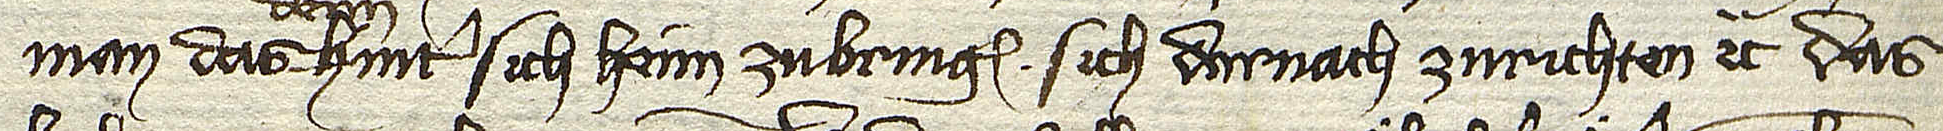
man das hint* ſich heim ʒubring* . ſich darnach ʒurichten ec* Das
